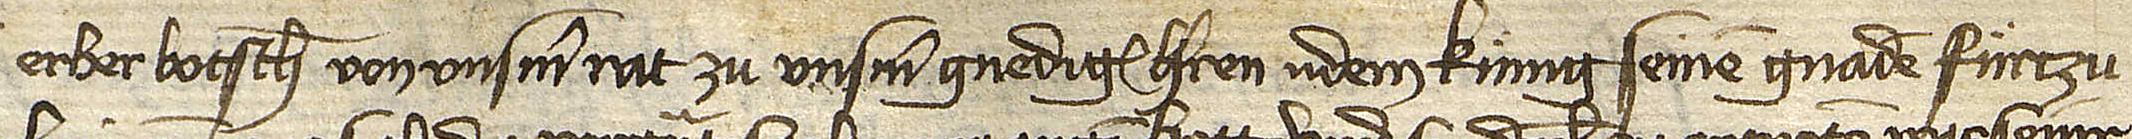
erber botſch* von vnſm* rat ʒu vnſm* gnedig* h*ren ~ dem künig ſeine* gnade* fürcʒu
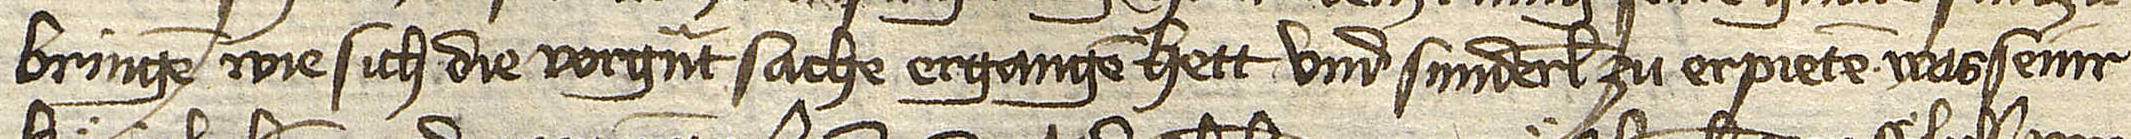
bringe* wie ſich die vorgnt* ſache ergange* hett / Vnd ſunderl* ʒu erpiete* was ſeinr
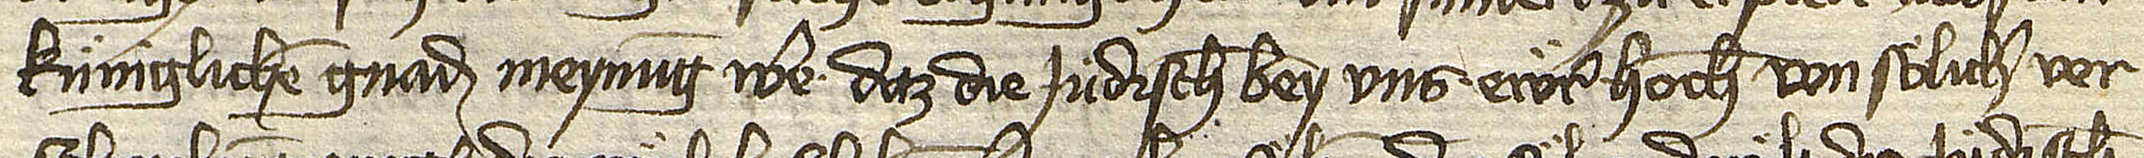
künigliche* gnad* meynu*g w*e . daʒ die Iüdiſch* bey vns eẅr* hoch* von ſölich* ver
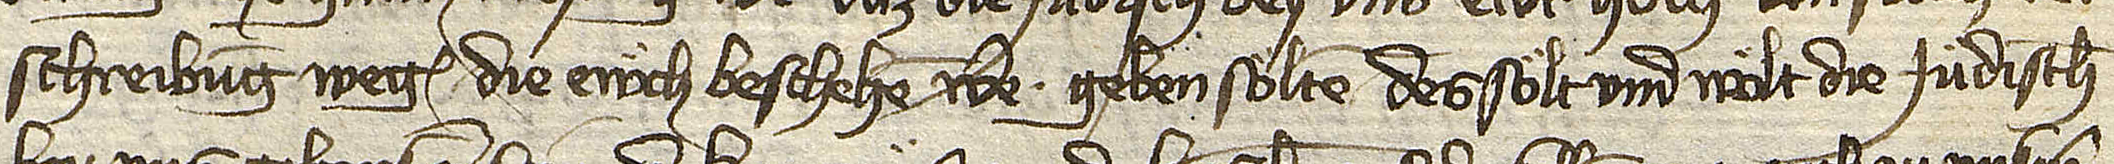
ſchreibu*g weg* / die eẅch beſchehe* w*e . geben ſölte* / des ſölt vnd wölt die Iüdiſch*
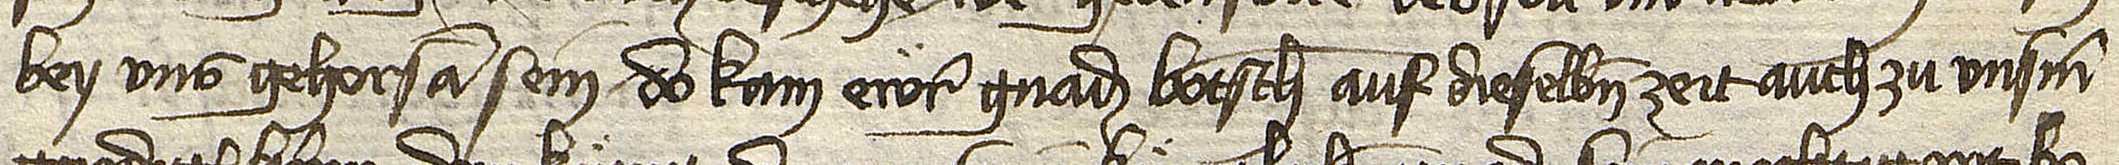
bey vns gehörſa* ſein / do kam eẅr* gnad* botſch* auf dieſelbn* ʒeit auch ʒu vnſm*
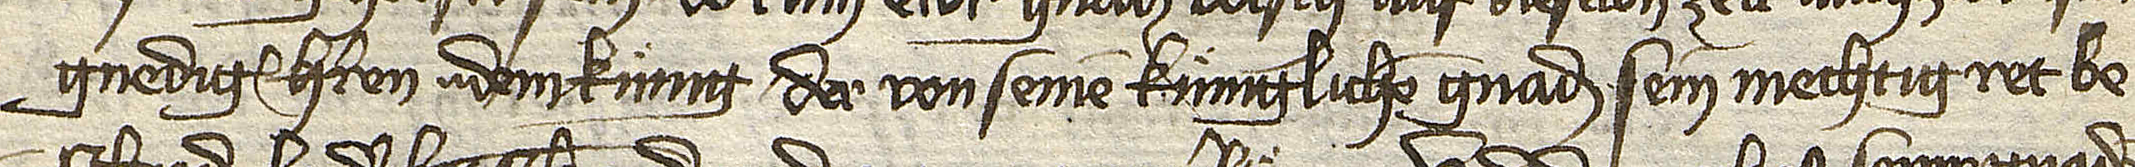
gnedig* h*ren ~ dem künig / der von ſeine* künigliche* gnad* ſein mechtig ret be
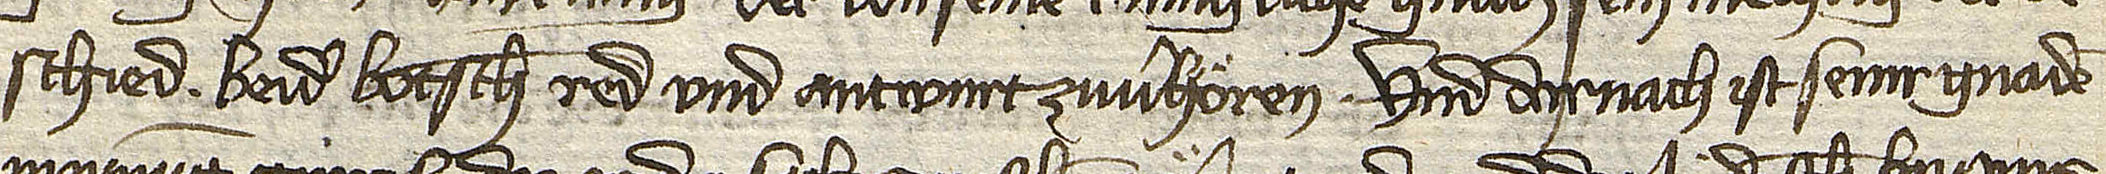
ſchied . beid* botſch* red vnd antwurt ʒuu*hören . Vnd darnach iſt ſeinr gnade*
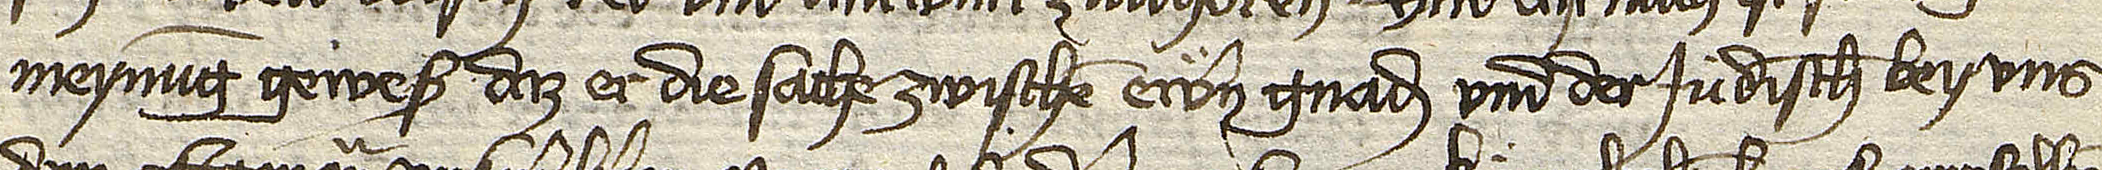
meynu*g geweſ* daʒ er die ſache ʒwiſche* eẅ*n gnad* vnd der Iüdiſch* bey vns
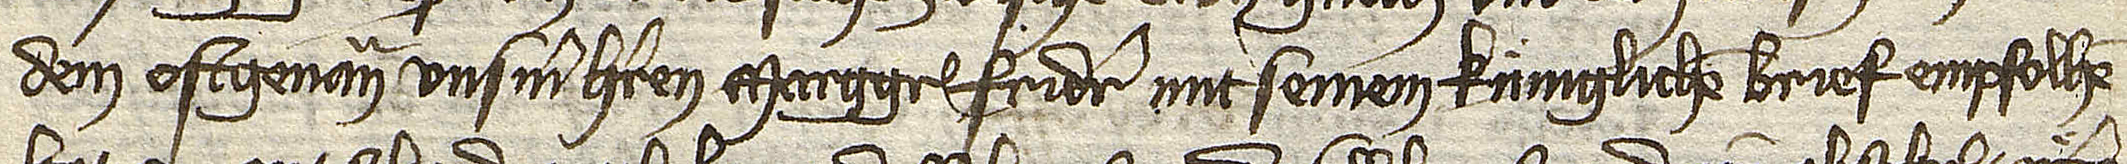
dem oftgenan* vnſm* h*ren Marggr* fridr* mit ſeinem künigliche* brief empfolhe*
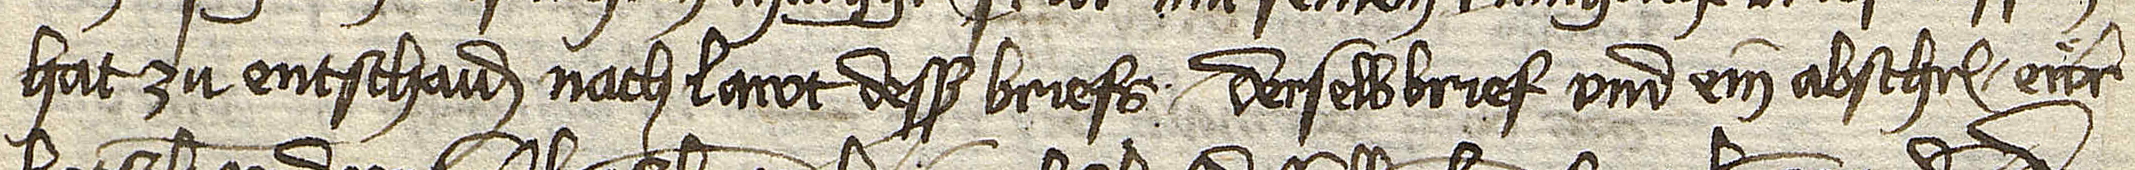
hat ʒu entſchaid* nach lawt deſſ* briefs / Derſelb brief vnd ein abſchr* / eẅr*
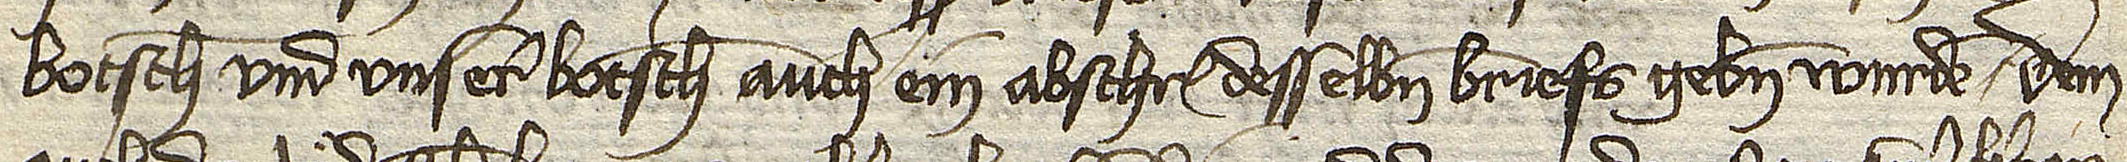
botſch* vnd vnſer* botſch* auch ein abſchr* deſſelbn* briefs gebn* wurde* / Denn
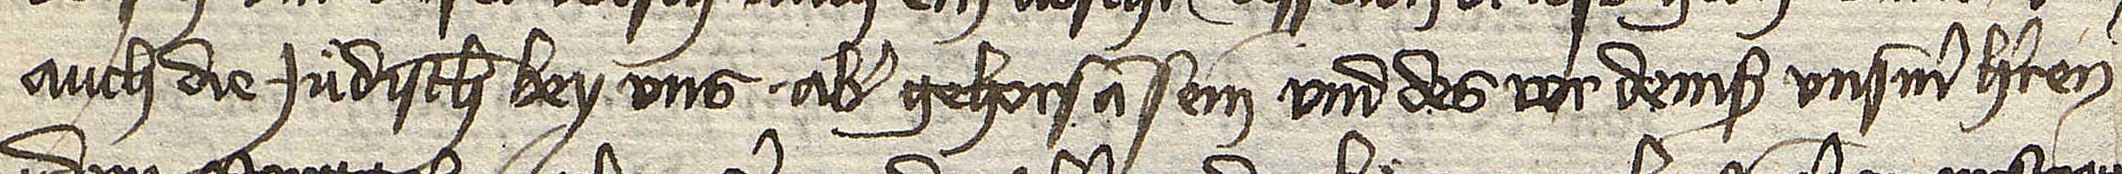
auch die Iüdiſch* bey vns ab* gehorſa* ſein vnd des vor demſ* vnſm* h*ren
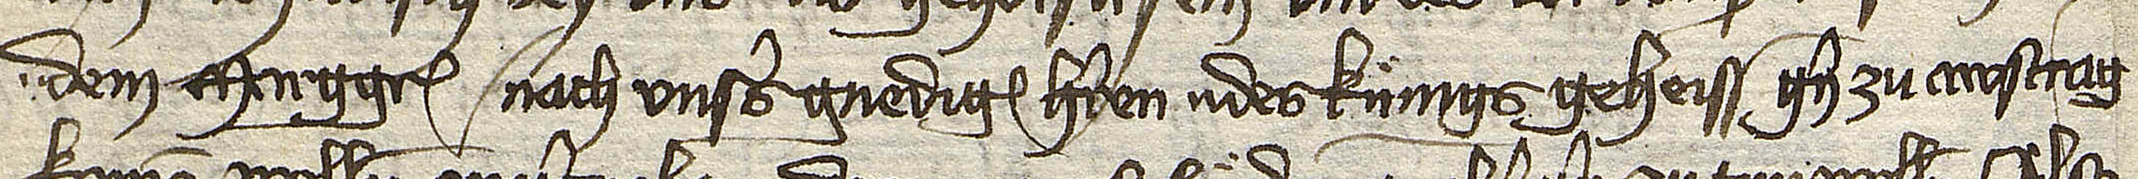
dem Marggr* / nach vnſ*s gnedig* h*ren ~ des künigs geheiſſ g*n ʒu awſtrag
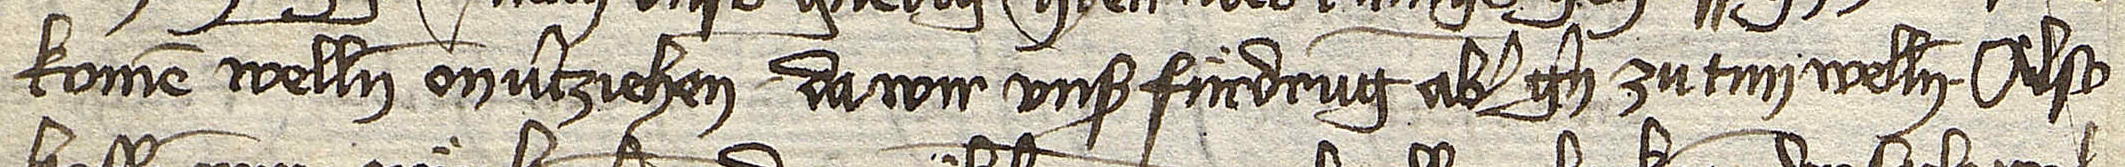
kome* welln* onu*cʒiehen / da wir vnſ* fürdru*g ab* g*n ʒu tun welln* . Alſo
